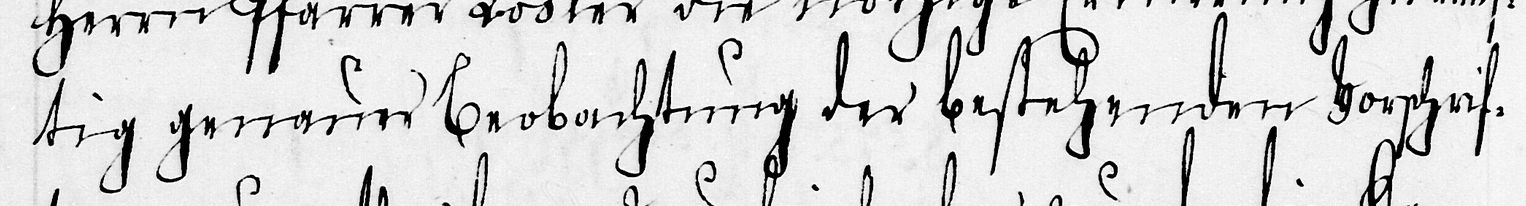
tig genauer Beobachtung der bestehenden Vorschrif¬
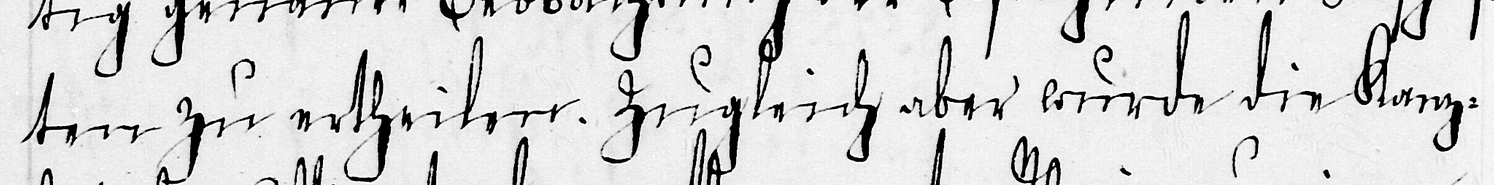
ten zu ertheilen. Zugleich aber wurde die Kanz¬
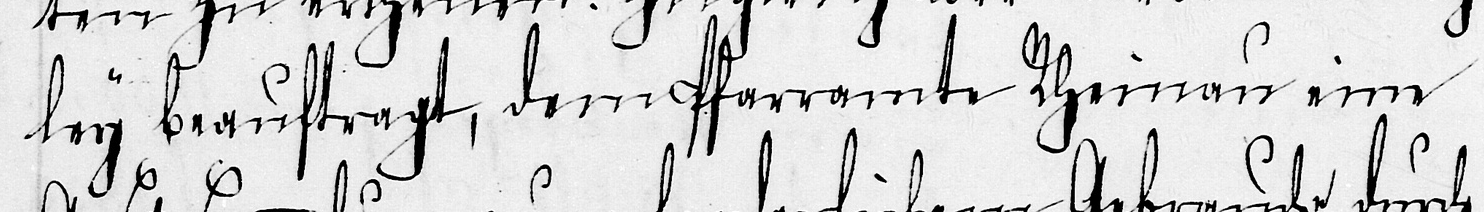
ley beauftragt, dem Pfarramte Rheinau eine
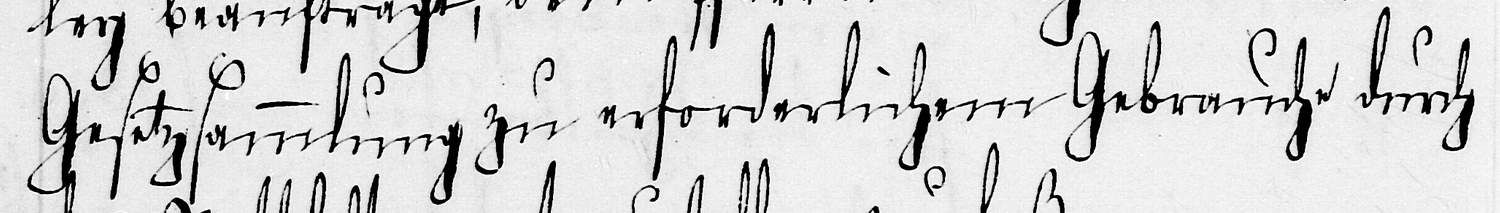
Gesetzsammlung zu erforderlichem Gebrauche durch
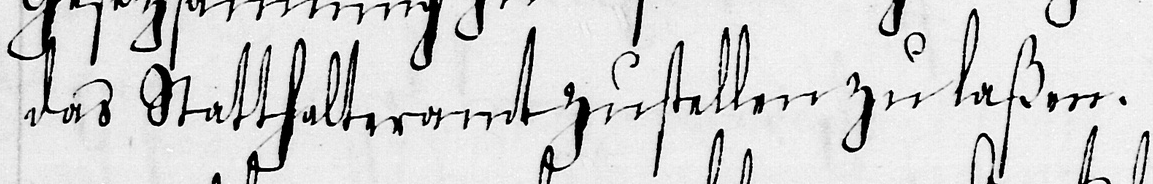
das Statthalteramt zustellen zu laßen.
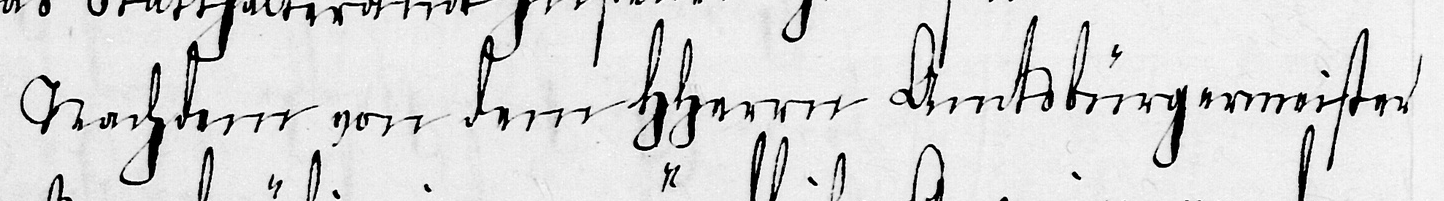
Nachdem von dem HHerrn Amtsbürgermeister
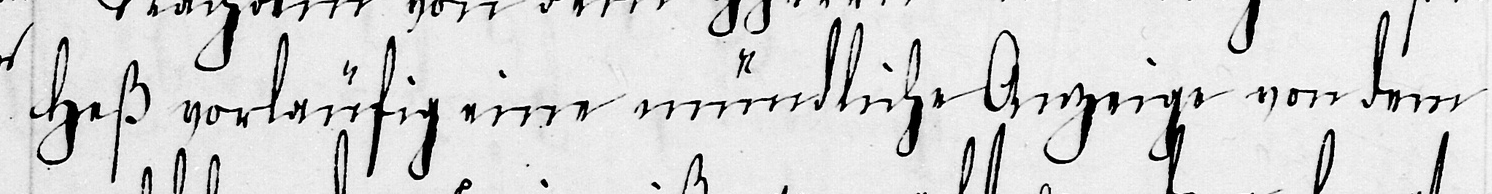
Heß vorläufig eine mündliche Anzeige von dem
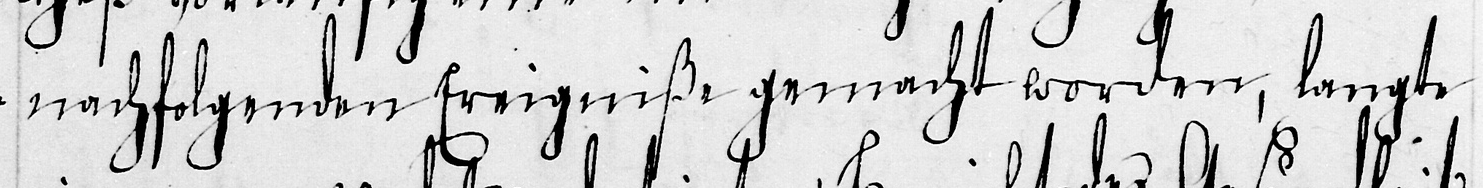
nachfolgenden Ereigniße gemacht worden, langte
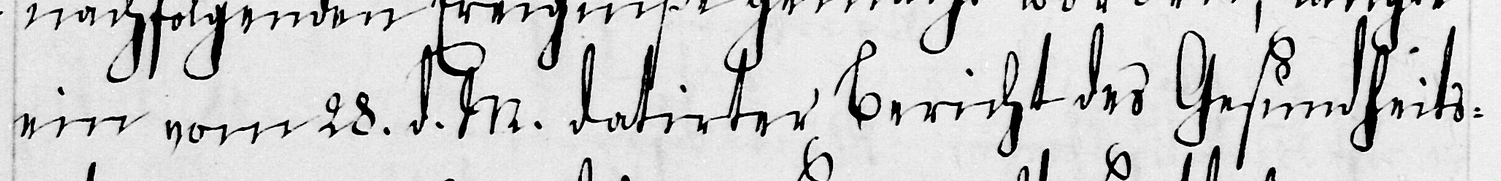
ein vom 28. d. M. datirter Bericht des Gesundheits¬
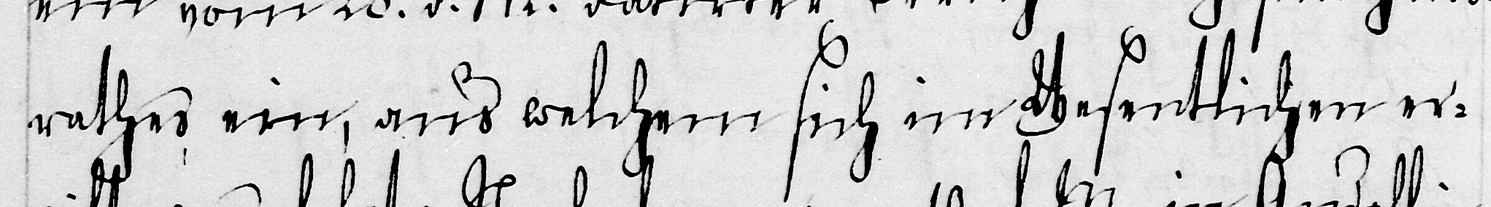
rathes ein, aus welchem sich im Wesentlichen er¬
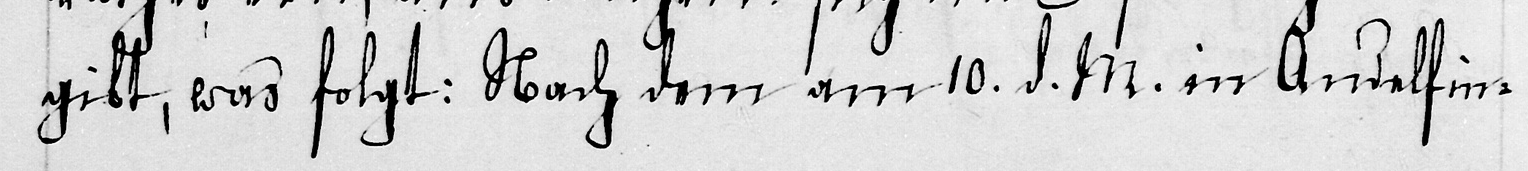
gibt, was folgt: Nach dem am 10. d. M. in Andelfin-
